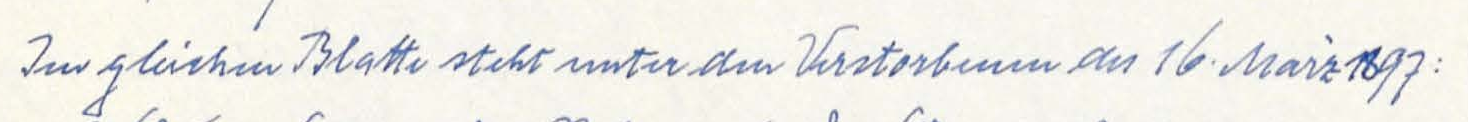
Im gleiche Blatte steht unter den Verstorbenen des 16. März 1897:
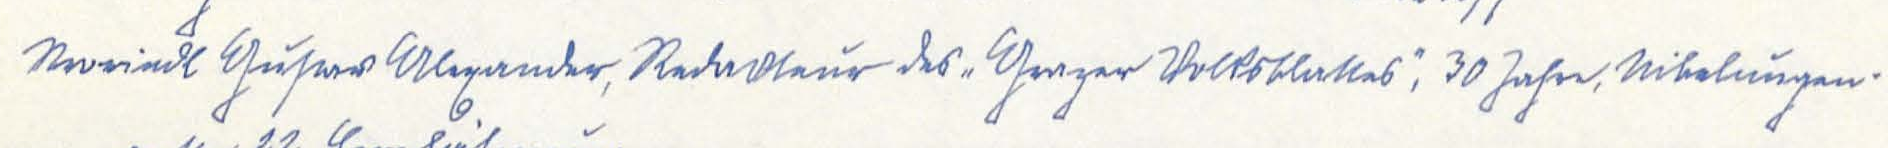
Stroriedl Gustav Alexander, Redakteur des „Grazer Volksblattes", 30 Jahre, Nibelungen-
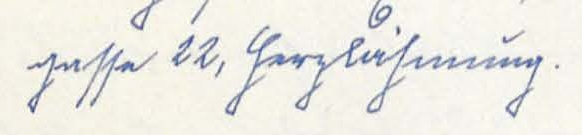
gasse 22, Herzlähmung.
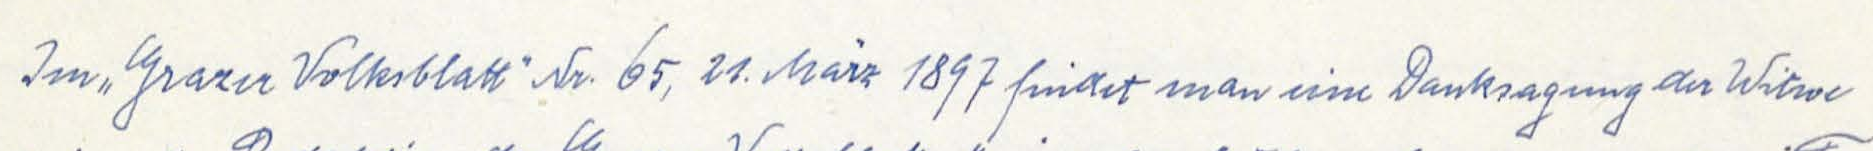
Im "Grazer Volksblatt" Nr. 65, 21. März 1897 findet man eine Danksagung der Witwe
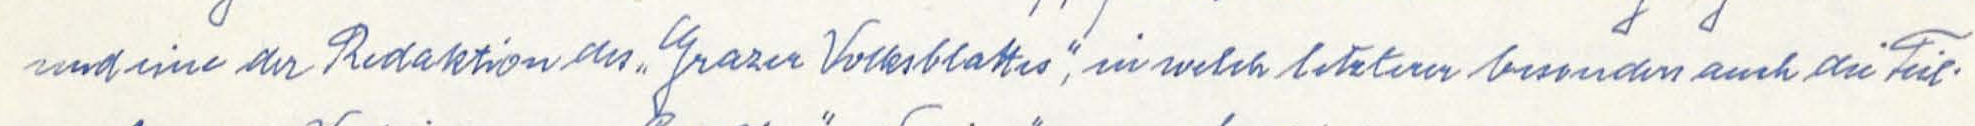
und eine der Redaktion des „Grazer Volksblattes“, in welch letzterer besonders auch die Teil-
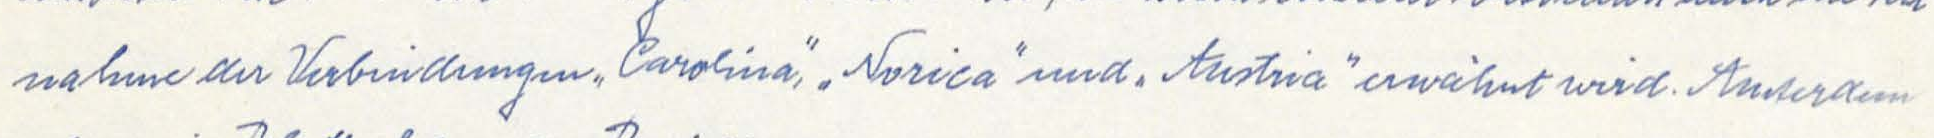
nahme der Verbindungen "Carolina", "Norica“ und "Austria" erwähnt wird. Außerdem
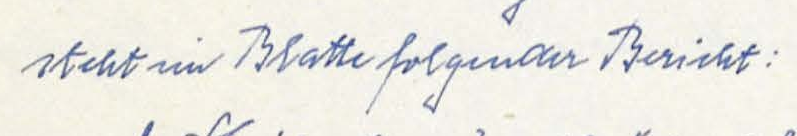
steht im Blatte folgender Bericht:
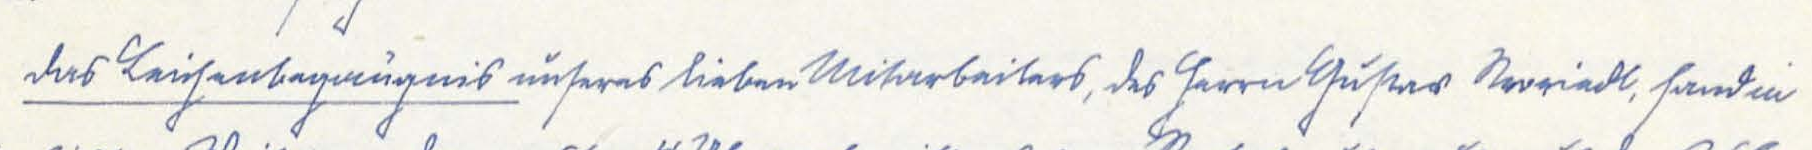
Das Leichenbegängnis unseres lieben Mitarbeiters, des Herrn Gustav Stroriedl, fand in
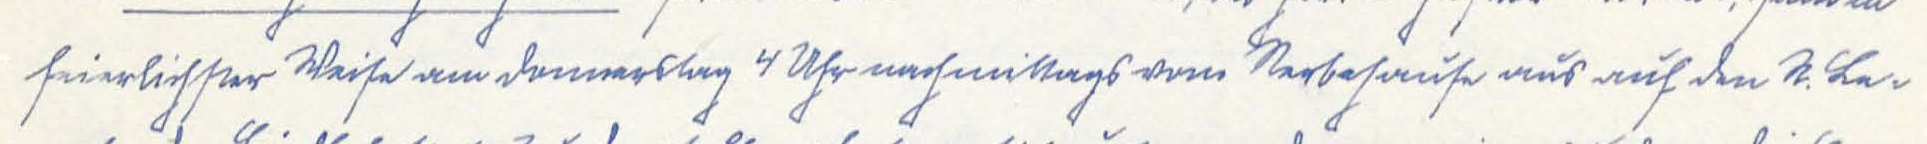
feierlichster Weise am Donnerstag 4 Uhr nachmittag vom Sterbehause aus auf den St. Le-
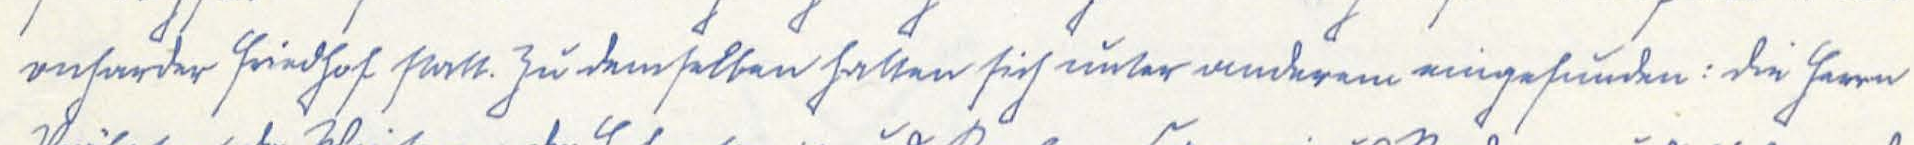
onharder Friedhof statt. Zu demselben hatten sich unter anderem eingefunden: Die Herrn
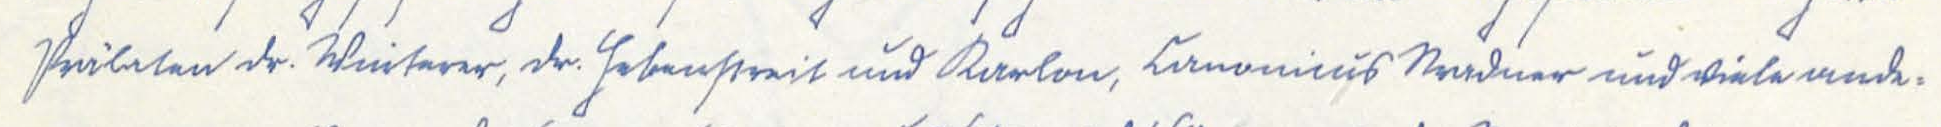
Prälaten Dr. Winterer, Dr. Hebenstreit und Karlon, Canonicus Stradner und viele ande-
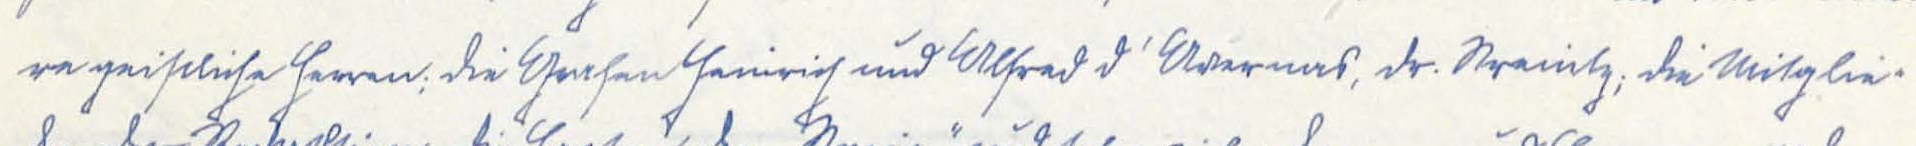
re geistliche Herren; die Grafen Heinrich und Alfred d' Avernas, Dr. Streintz; die Mitglie-
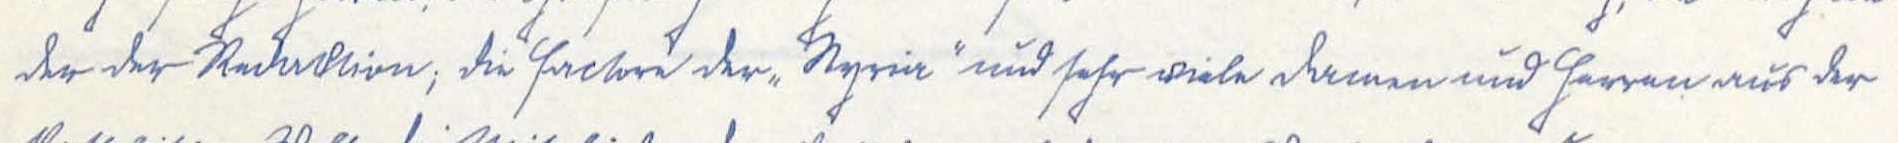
der der Redaktion; die Factorn der "Styria" und sehr viele Damen und Herren aus der
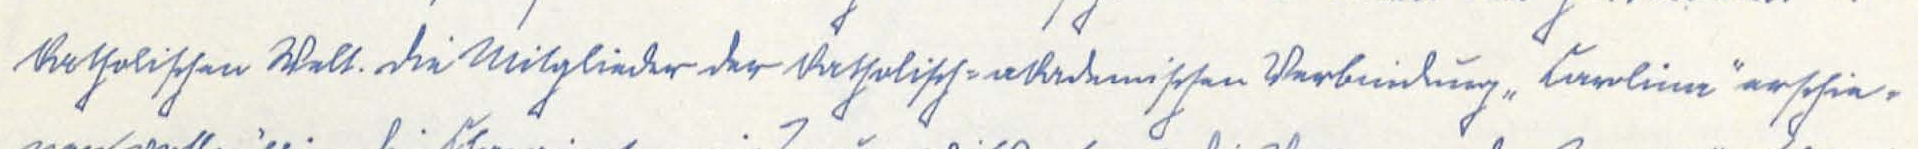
katholischen Welt. Die Mitglieder der katholisch- akademischen Verbindung "Carolina" erschien-
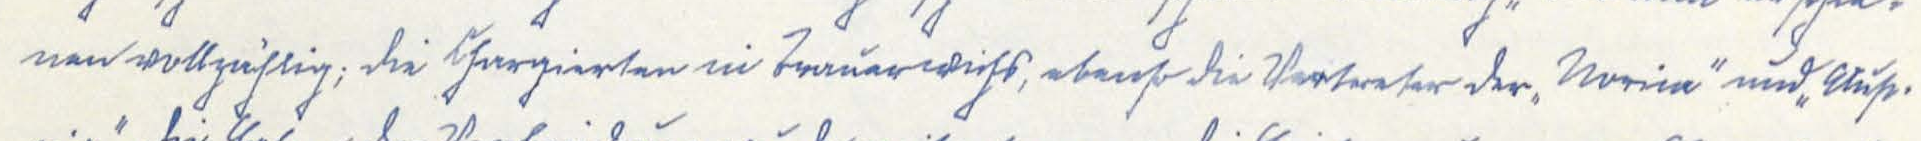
nen vollzählig; die Chargierten in Trauerwichs, ebenso die Vertreter der „Norica" und "Aus-
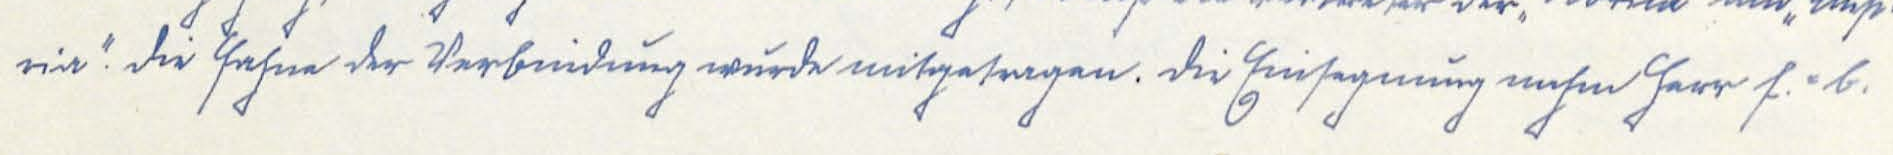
ria". Die Fahne der Verbindung wurde mitgetragen. Die Einsegnung nahm Herr f.-b.
